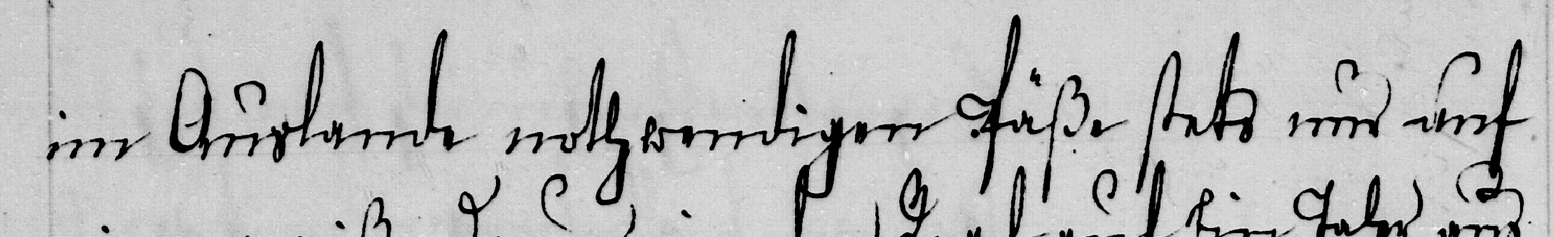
im Auslande nothwendigen Päße stets nur auf
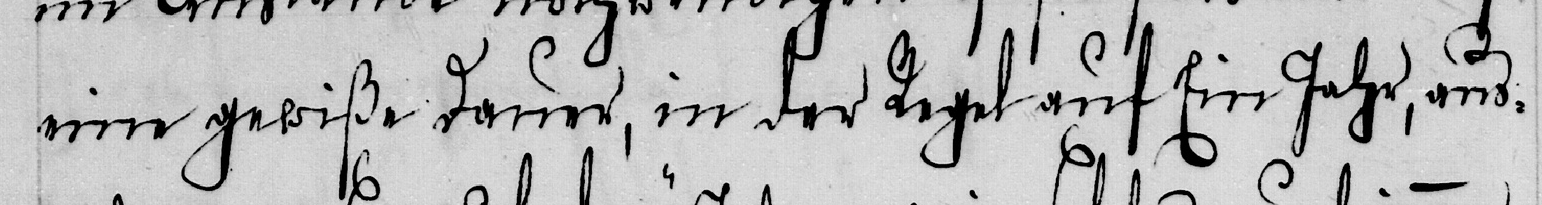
eine gewiße Dauer, in der Regel auf Ein Jahr, aus¬
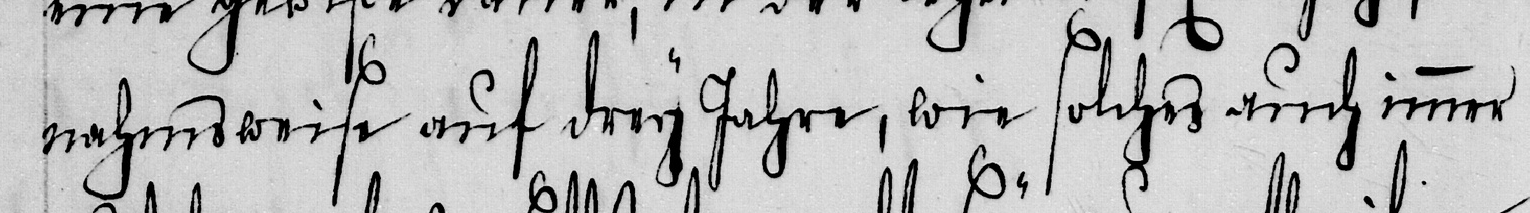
nahmsweise auf drey Jahre, wie solches auch immer
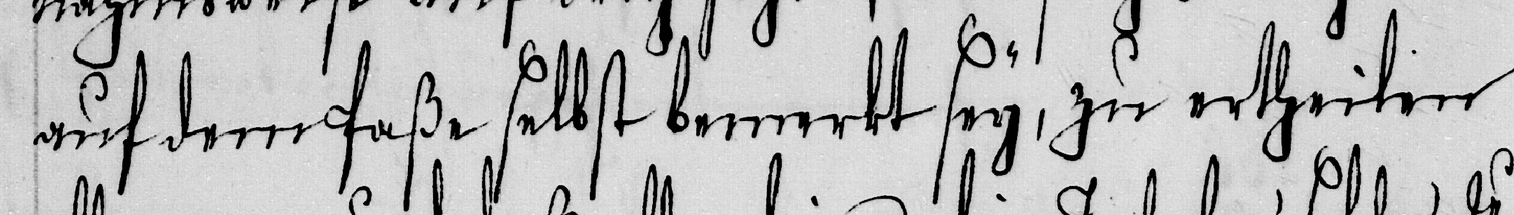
auf dem Paße selbst bemerkt sey, zu ertheilen
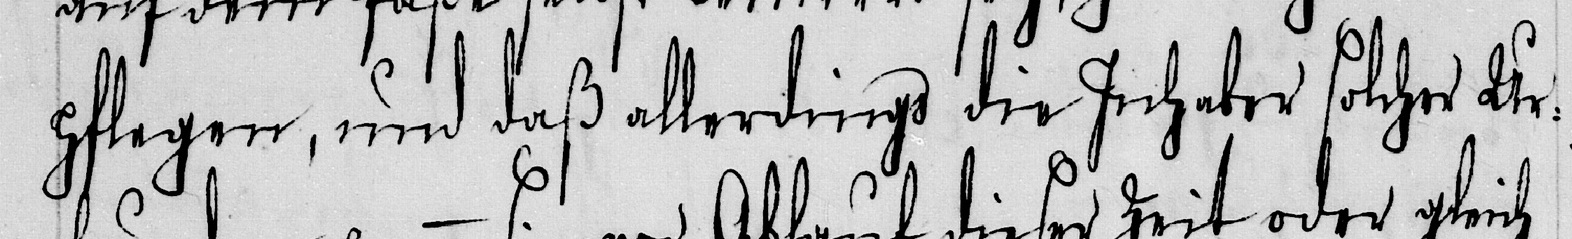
pflegen, und daß allerdings die Inhaber solcher U¬
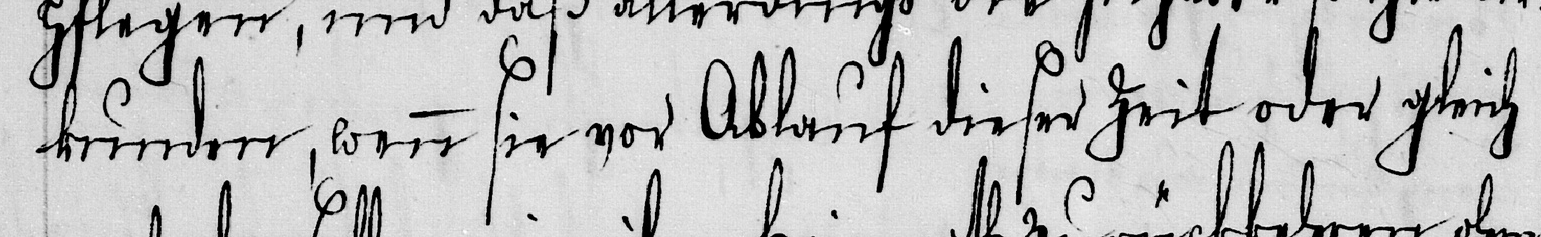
rkunden, wenn sie vor Ablauf dieser Zeit oder gleich
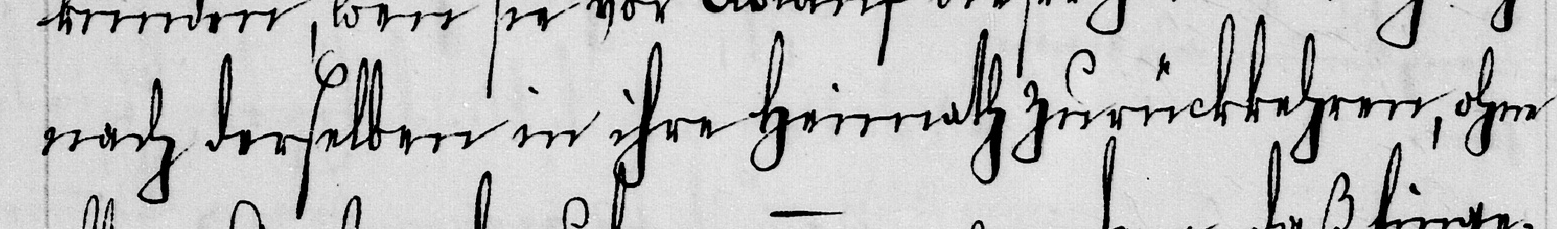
nach derselben in ihre Heimath zurückkehren, ohne
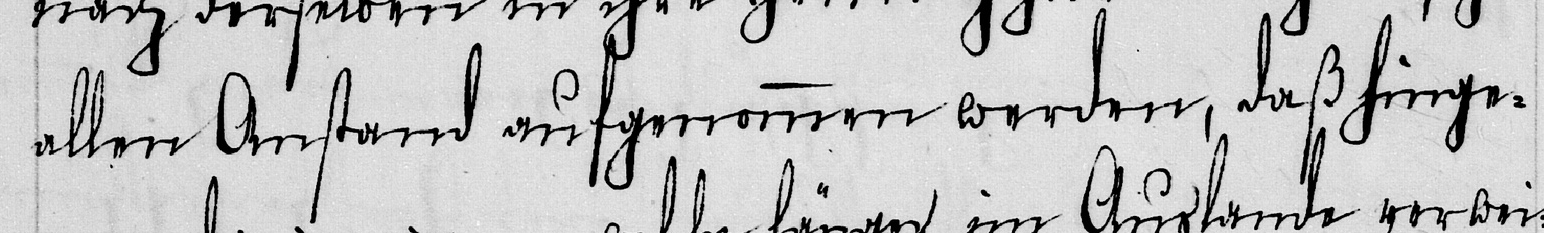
allen Anstand aufgenommen werden, daß hinge¬
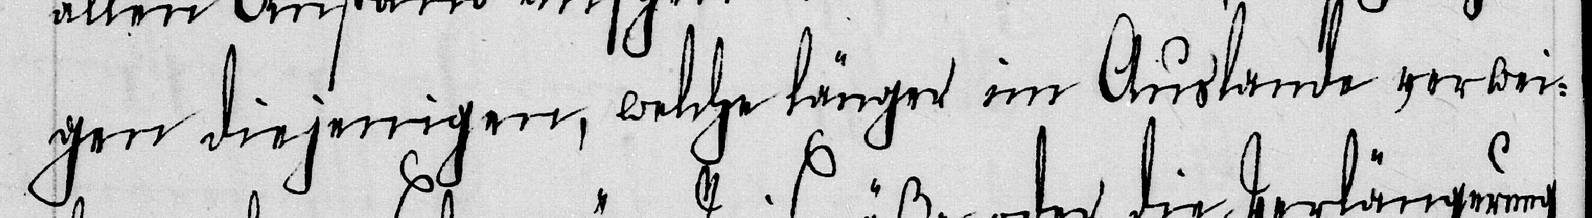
gen diejenigen, welche länger im Auslande verwei¬
